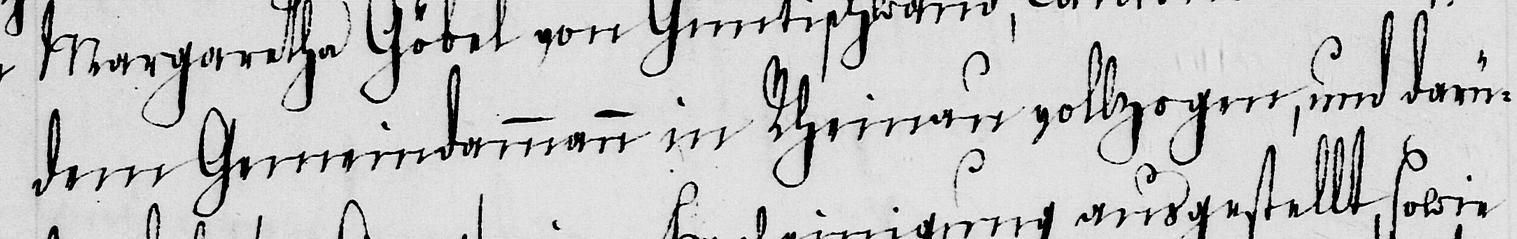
dem Gemeindammann in Rheinau vollzogen, und darü¬
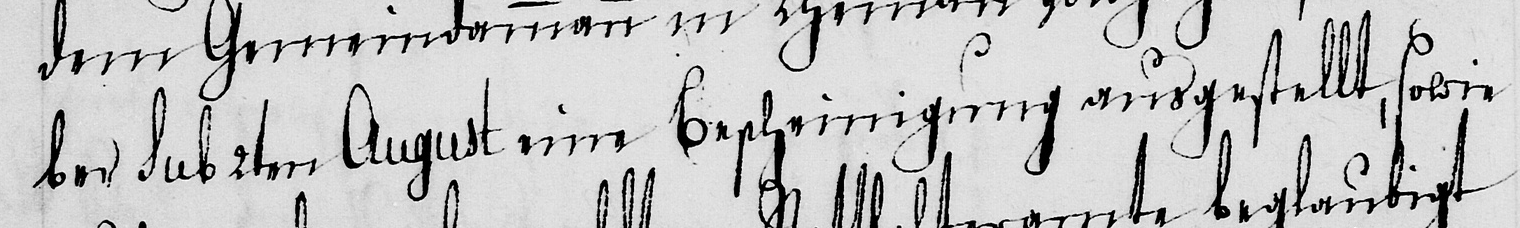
ber sub 2ten August eine Bescheinigung ausgestellt, sowie
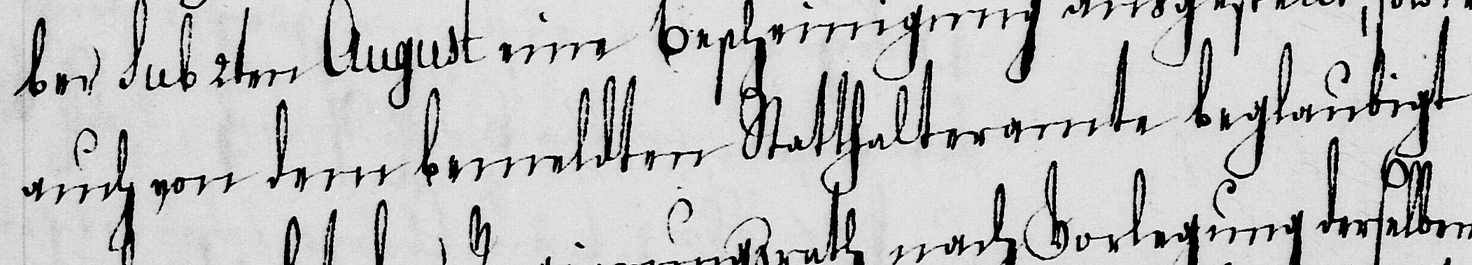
auch von dem bemeldten Statthalteramte beglaubigt
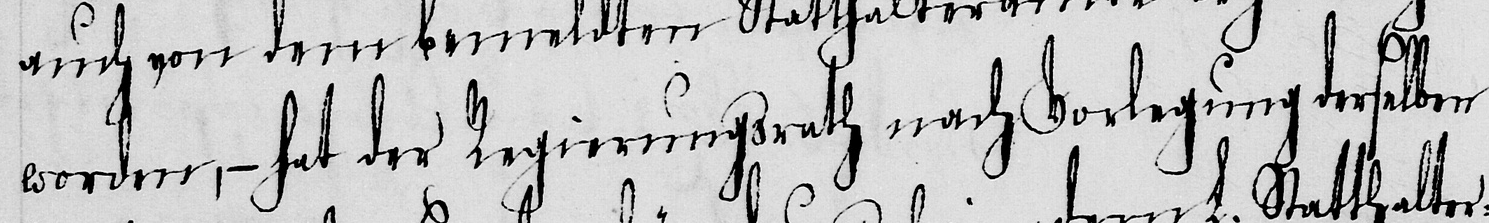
worden, – hat der Regierungsrath nach Vorlegung derselben
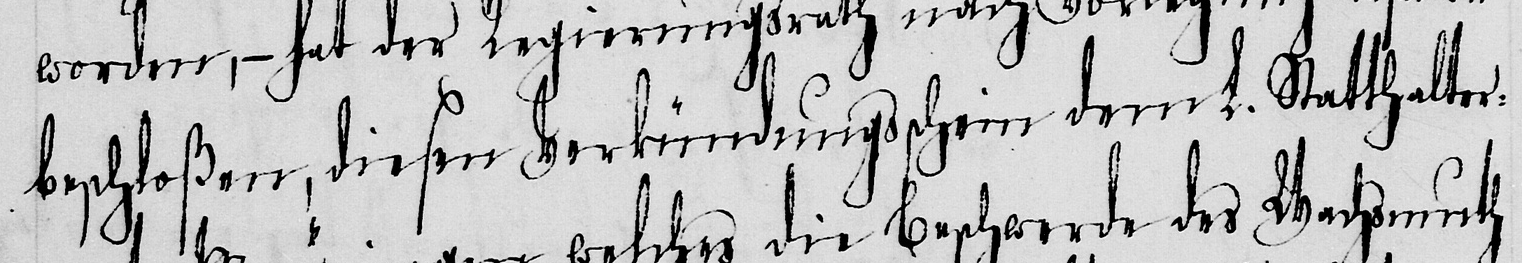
beschloßen, diesen Verkündungsschein dem L. Statthalter¬
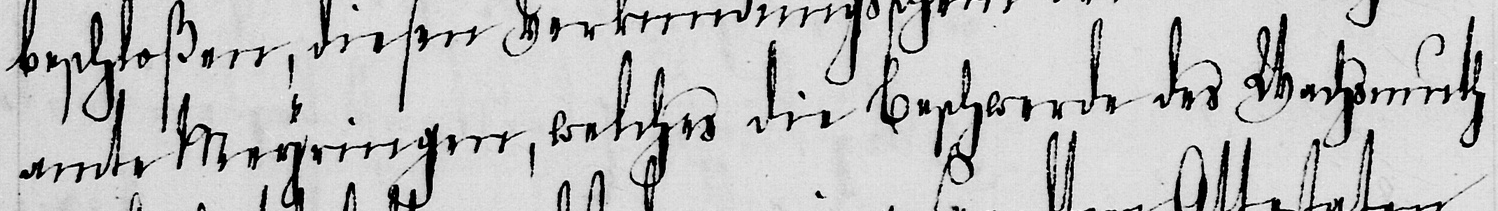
amte Meyringen, welches die Beschwerde des Wachsmuth
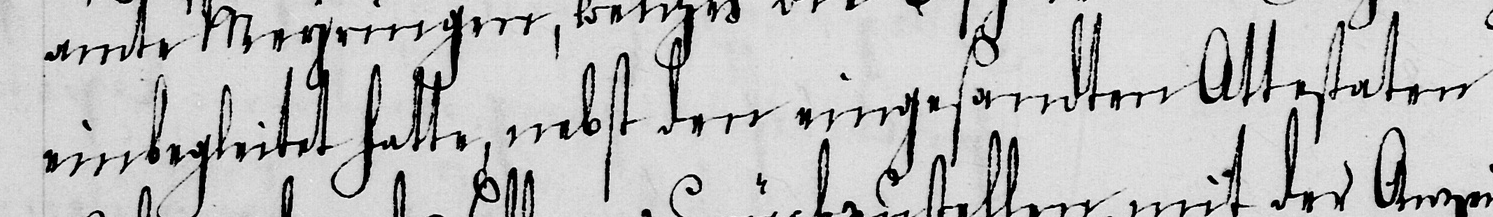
einbegleitet hatte, nebst den eingesandten Attestaten
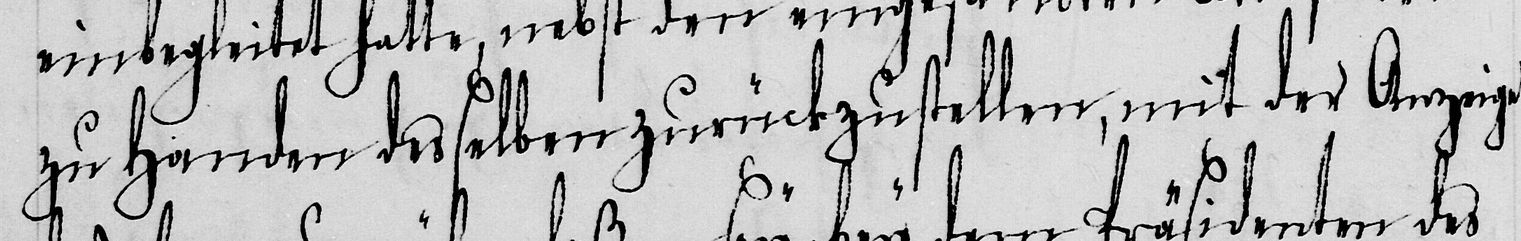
zu Handen desselben zurückzustellen, mit der Anzeig¬
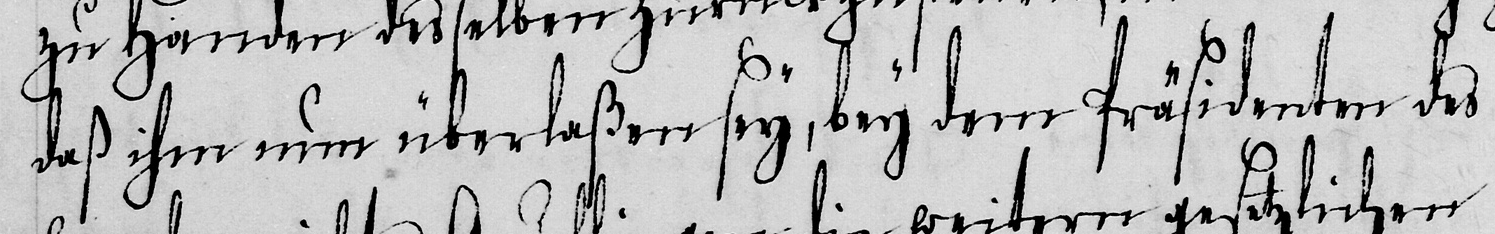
daß ihm nun überlaßen sey, bey dem Präsidenten des
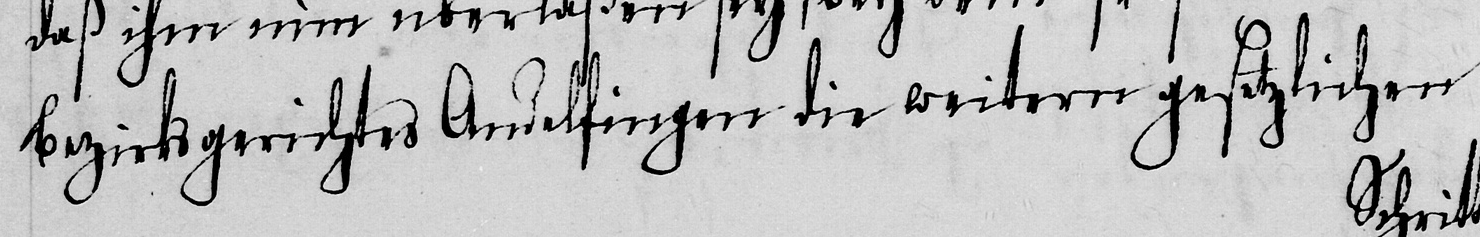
Bezirksgerichtes Andelfingen die weitern gesetzlichen
